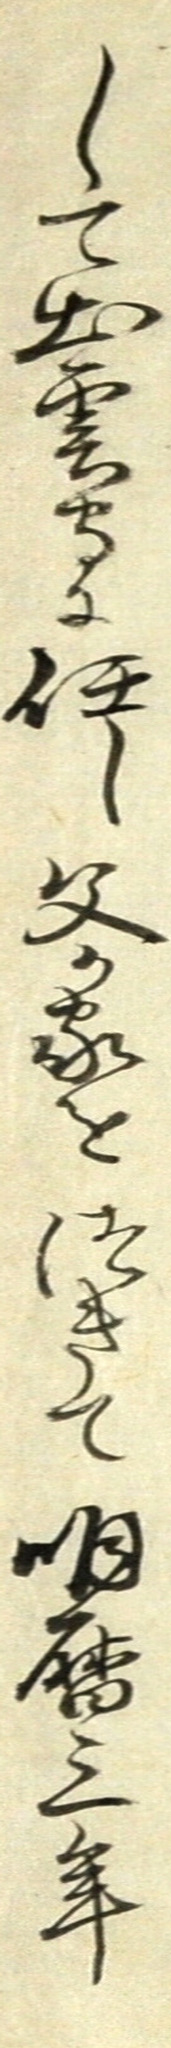して出雲守に任し父か家をつきて明暦三年

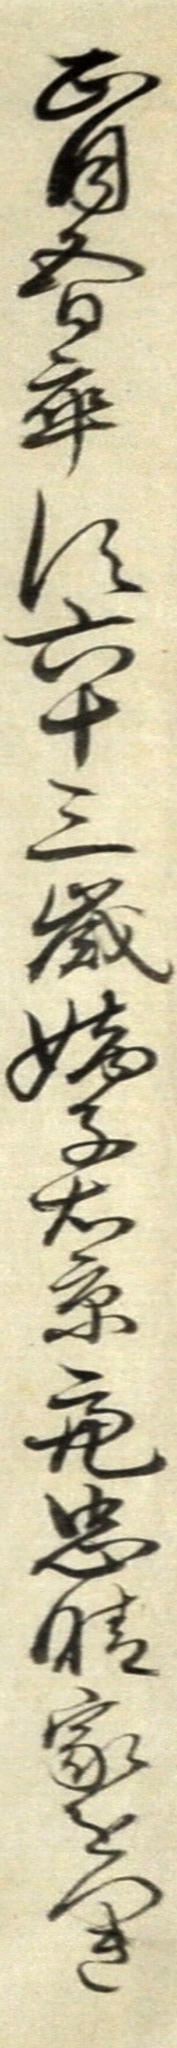正月五日卒す六十三歳嫡子右京亮忠晴家をつき
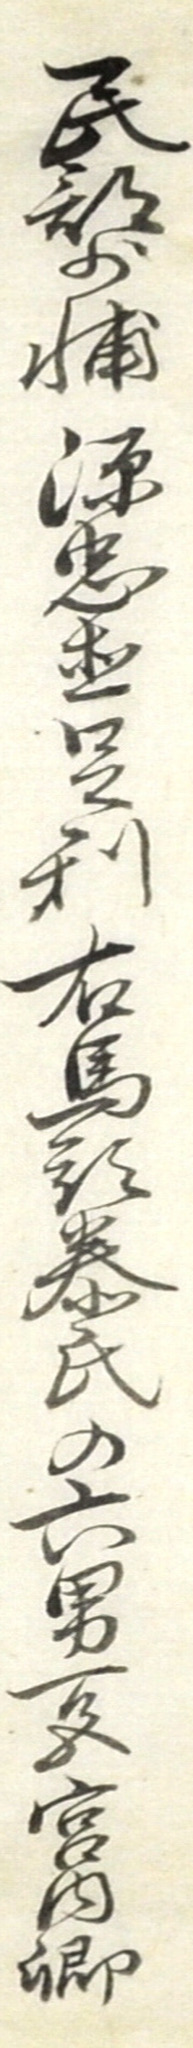民部少輔源忠直足利右馬頭秦氏の六男一色宮内卿
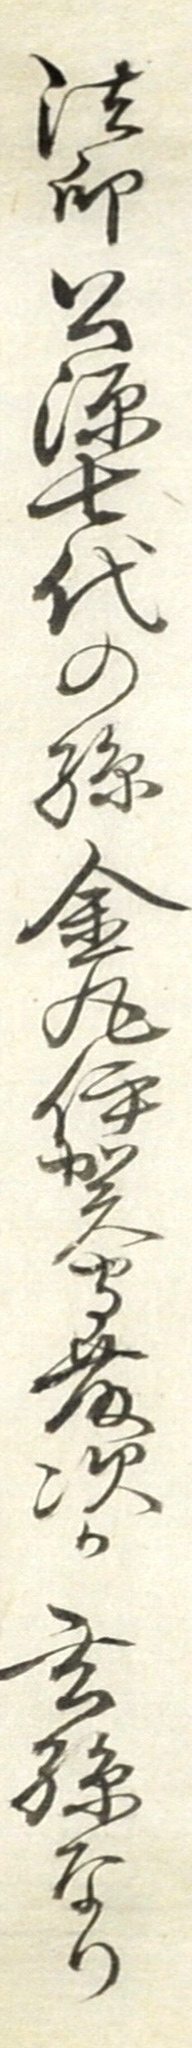法師公深七代の孫金丸伊賀守藤次か玄孫なり
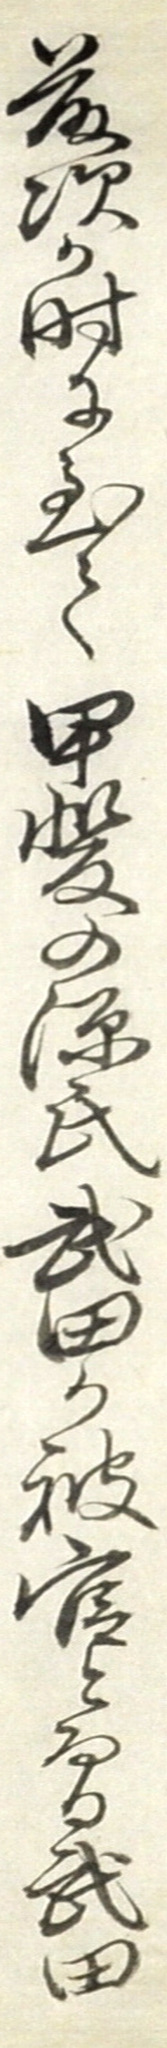藤次か時に至て甲斐の源氏武田か被官となる武田
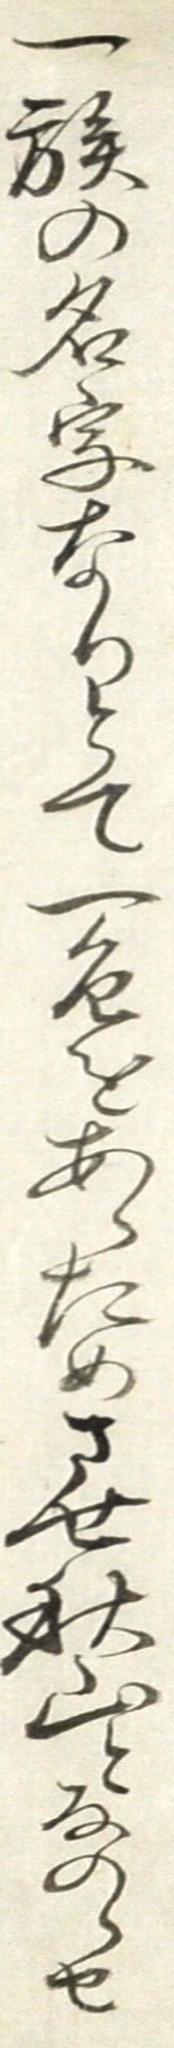一族の名字なりとて一色をあらためさせ秋山となのらせ
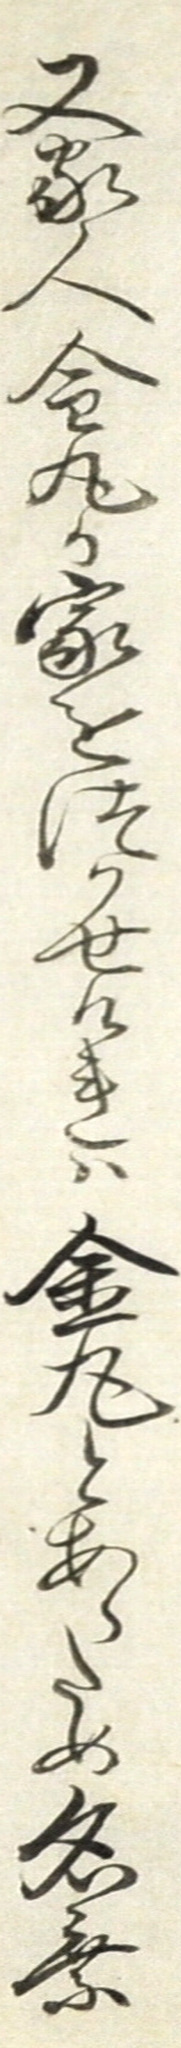又家人金丸か家をつかせけれは金丸とあらため名乗
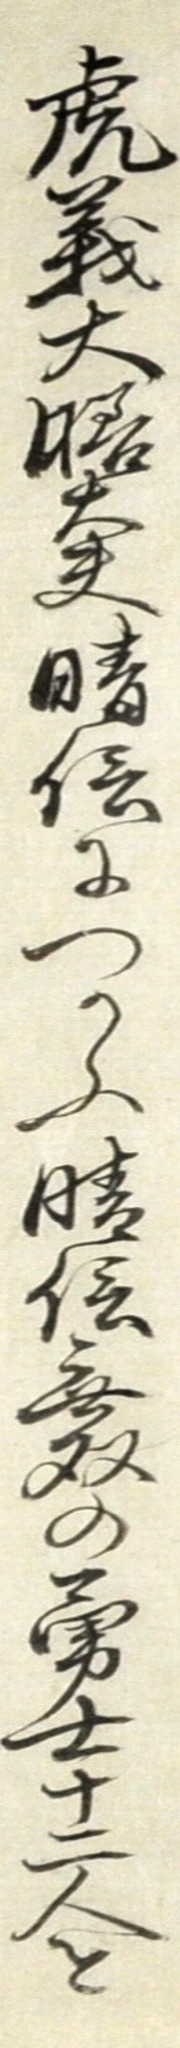虎義大膳大夫晴信につかふ晴信無双の勇士十二人を
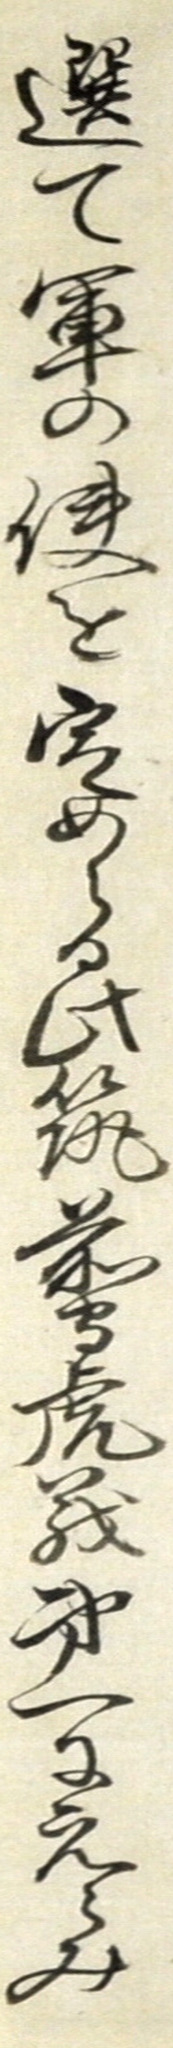選て軍の使を定めらる此筑前守虎義第一にえらみ

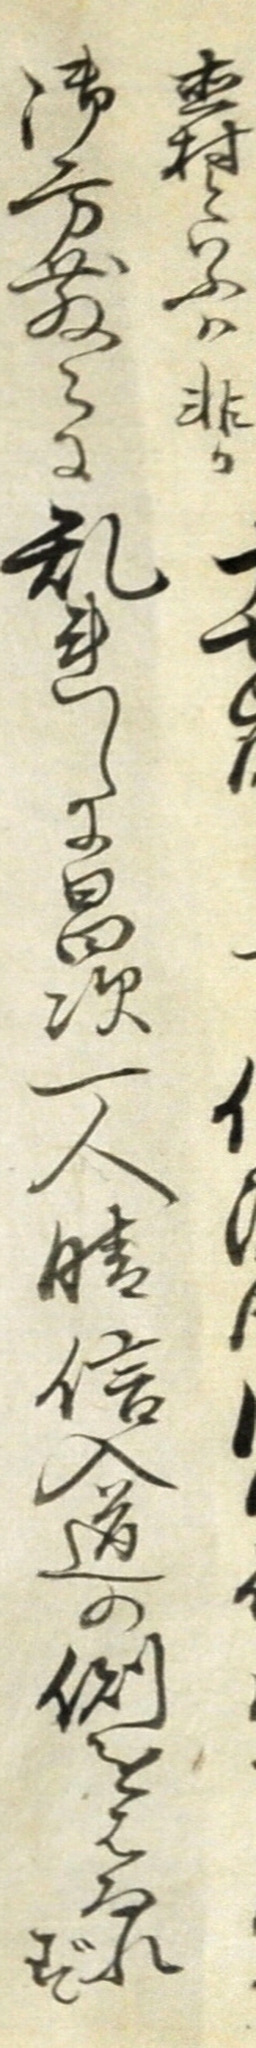御方散々に乱れしに昌次一人晴信入道の側をはなれず
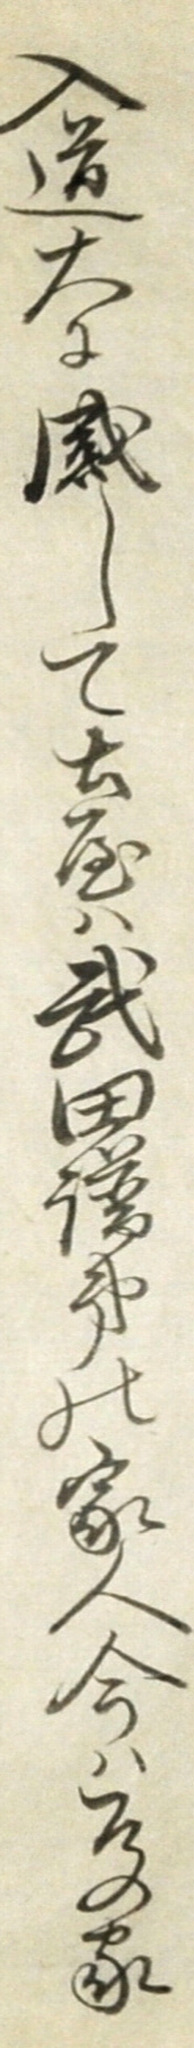入道大に感して土屋は武田譜第の家人今はその家
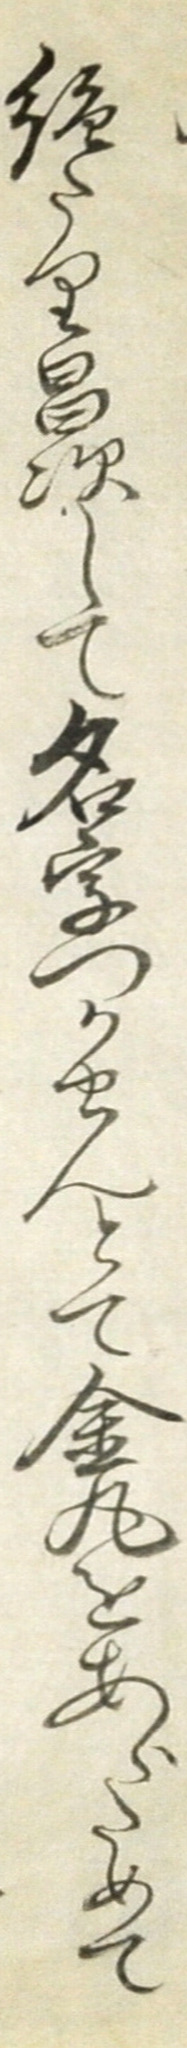絶たり昌次して名字つかせんとて金丸をあらためて
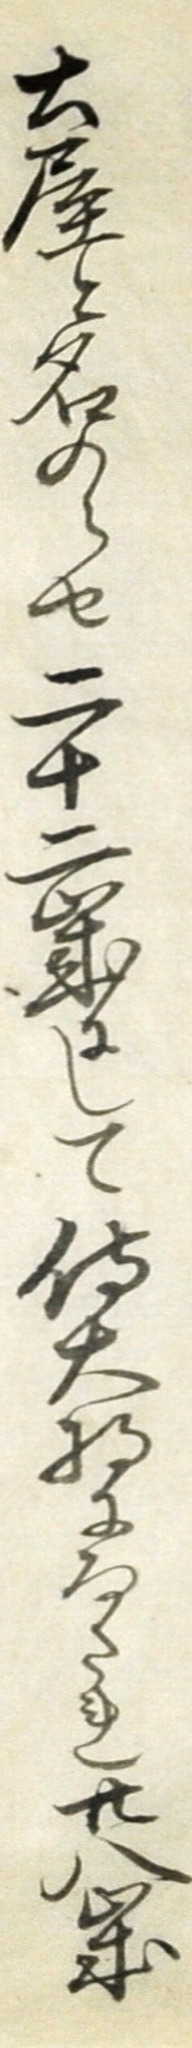土屋と名のらせ二十二歳にして侍大将になされ廿八歳
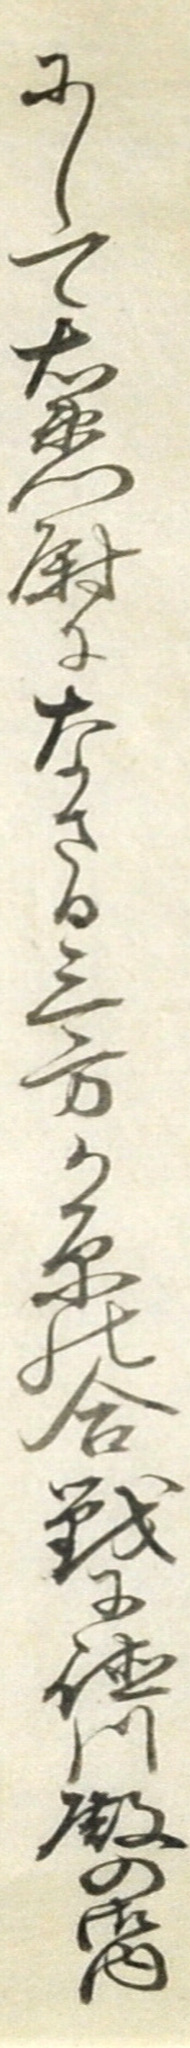にして右衛門尉になさる三方か原の合戦に徳川殿の御内
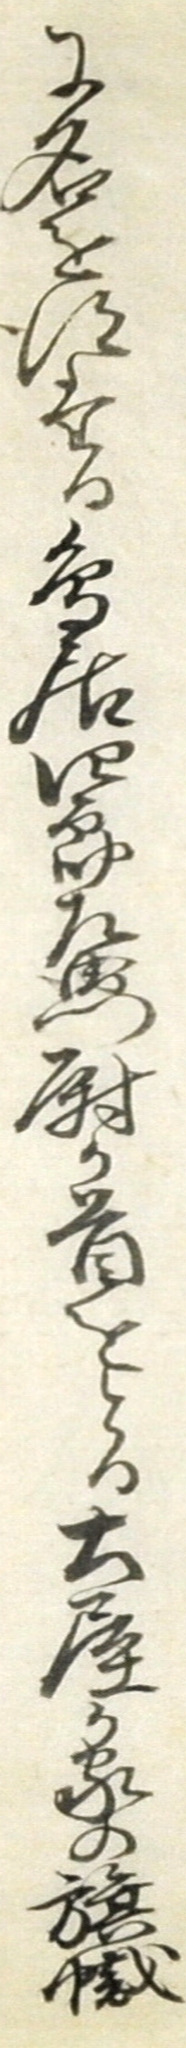に名を得たる鳥居四郎左衛門尉か首をとる土屋か家の旗幟
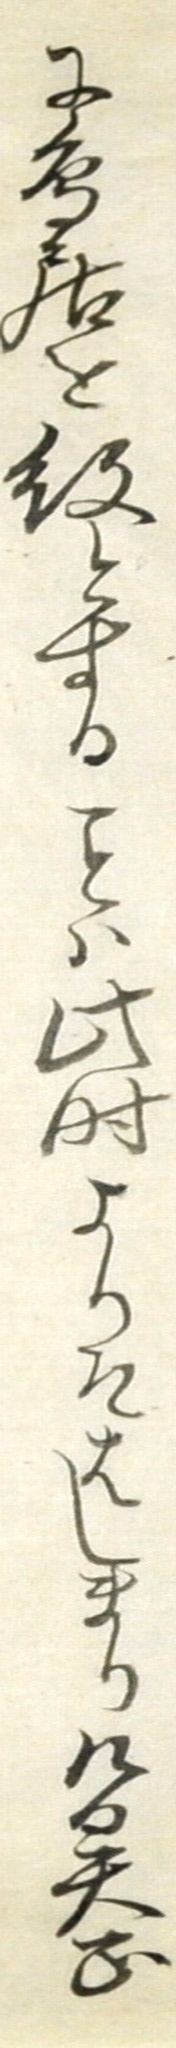に鳥居を紋とすることは此時よりそはしまりける天正
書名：藩翰譜（六）
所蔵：伊那市立高遠町図書館・合同会社AMANE
